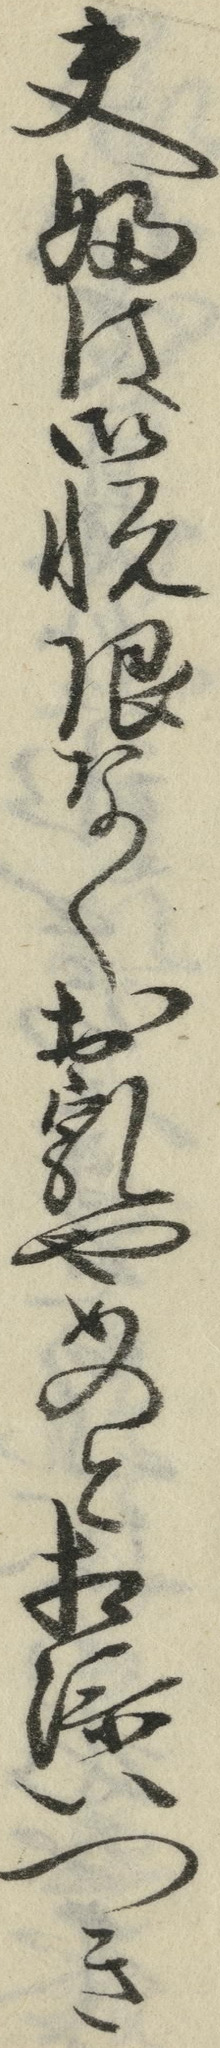夫婦は御悦限なくお乳やめのと相添いつき
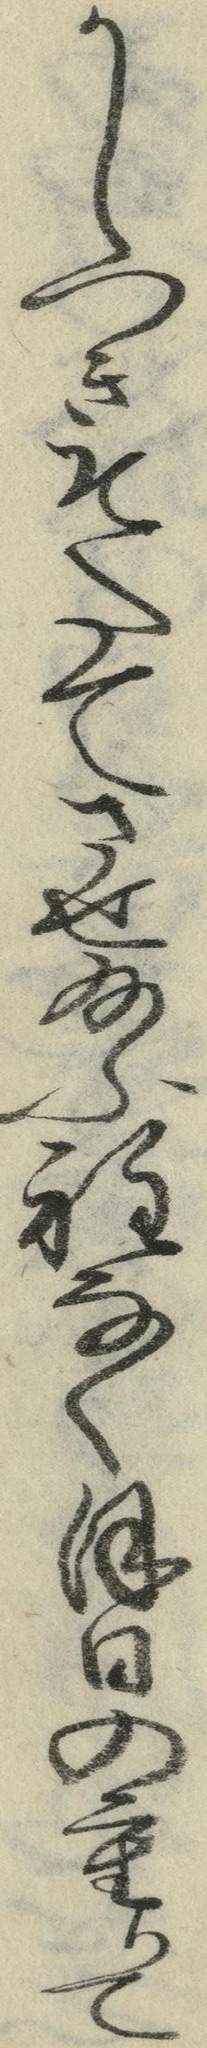かしつきそたてさせ給ふ程なく月日の重リて
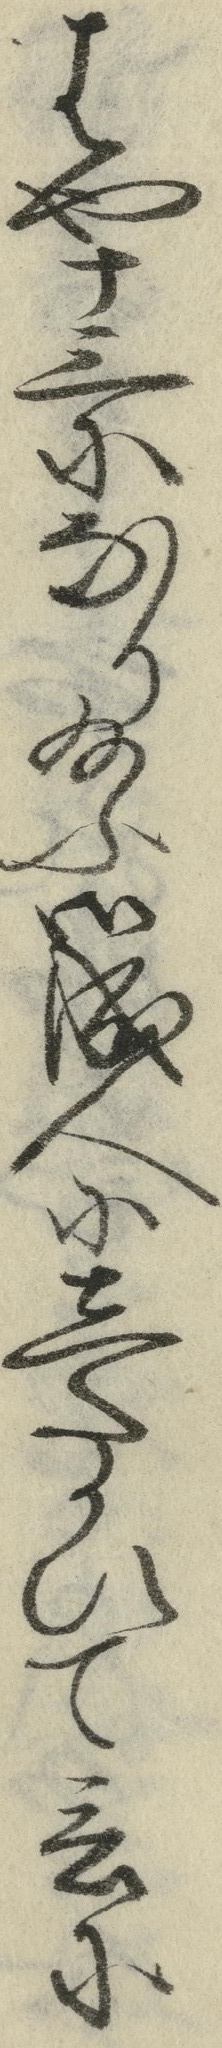はや十三になり給ふ御成人にしたかひて言に
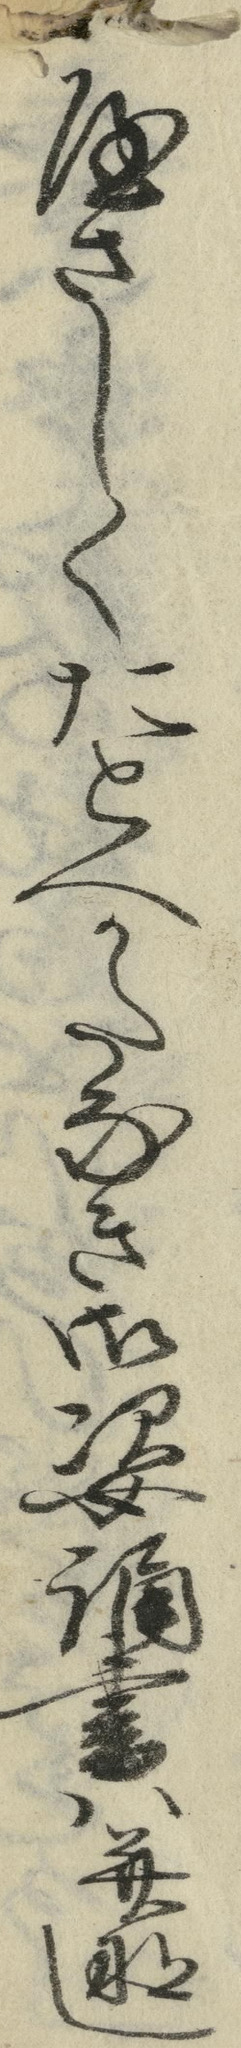やさしくたとへかたなき御姿誦書ハ幷なし
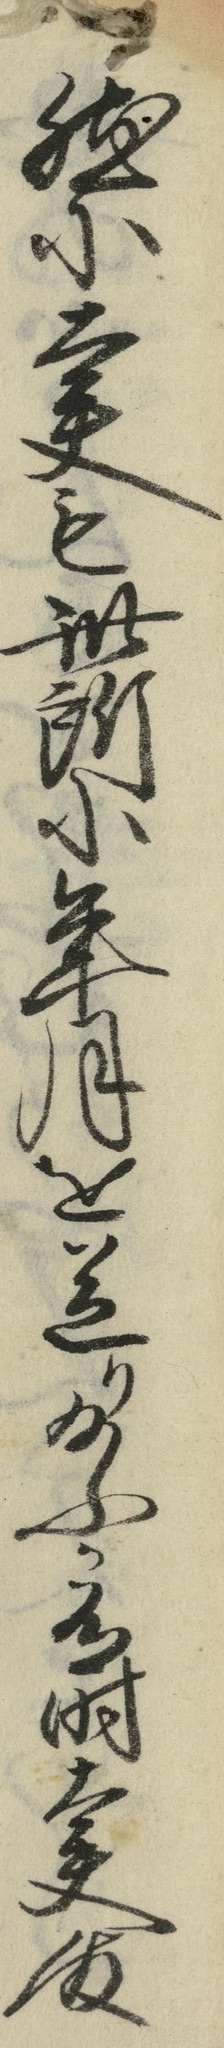然に太夫も此所に年月を送り給ふか有時太夫殿
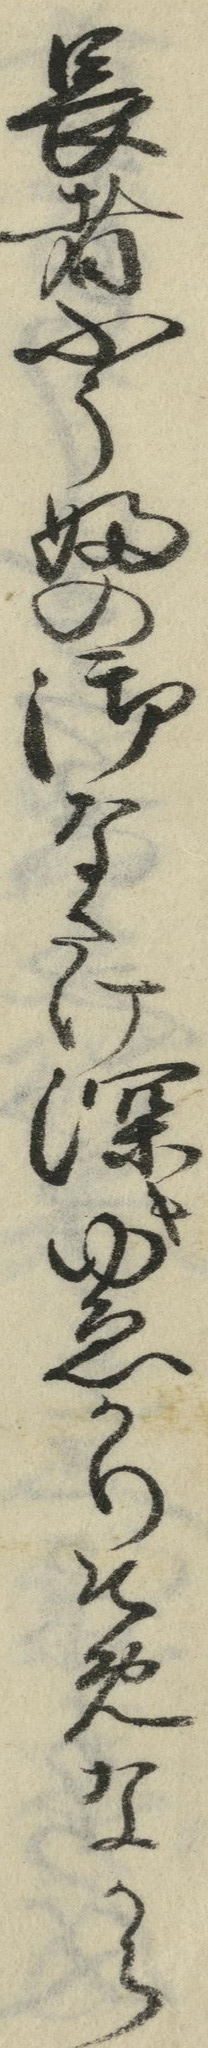長者ふうふの御なさけ深キゆゑかりそめなから
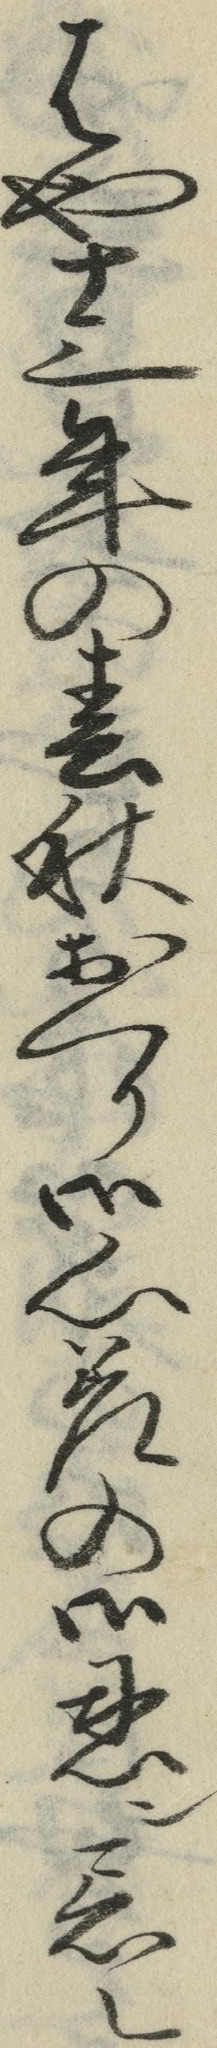はや十三年の春秋おくり御心差の御恩ン尽し
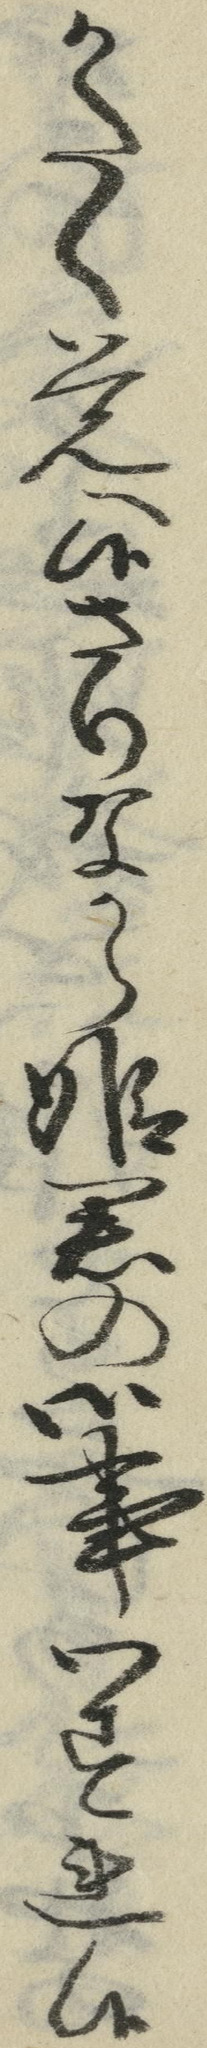かたく覚へ候さりなから姫君の御事わすれ候
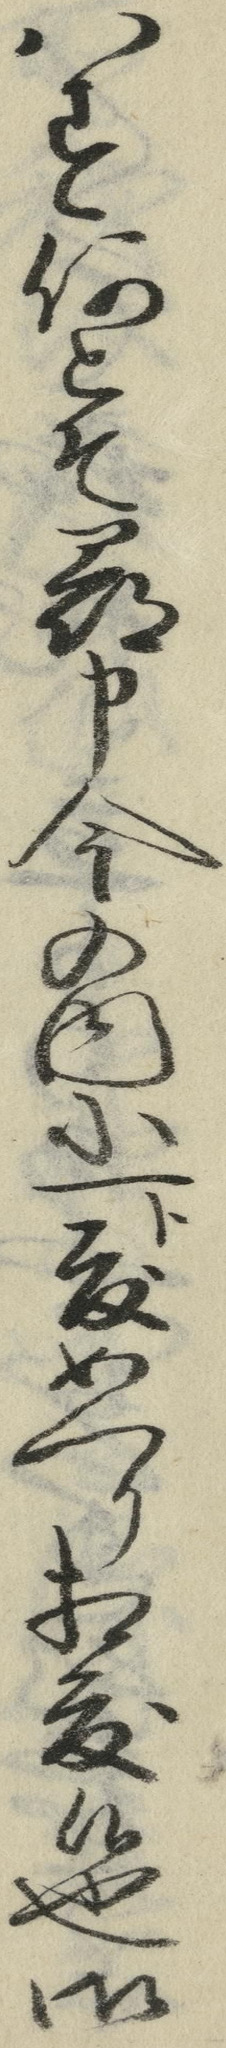ハす何とそ尋申今の内に一ト度めくり相度候也御
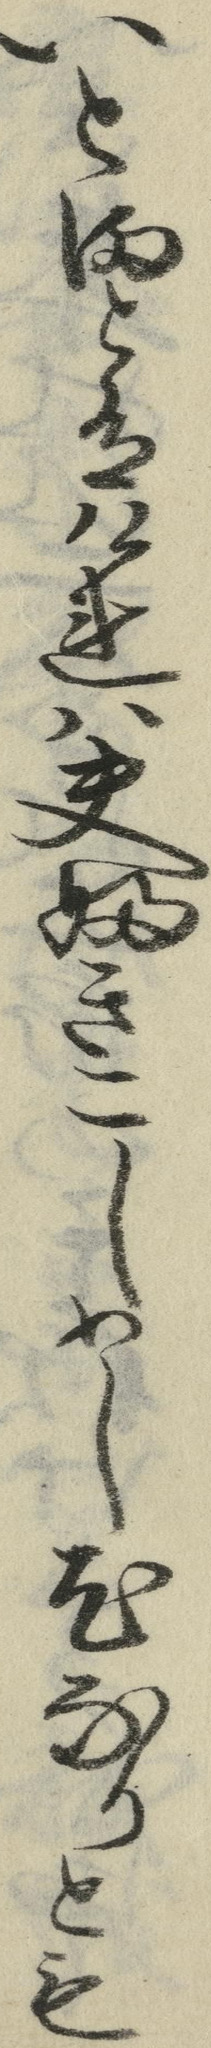いとまと有けれハ夫婦きこしめし尤なりとも
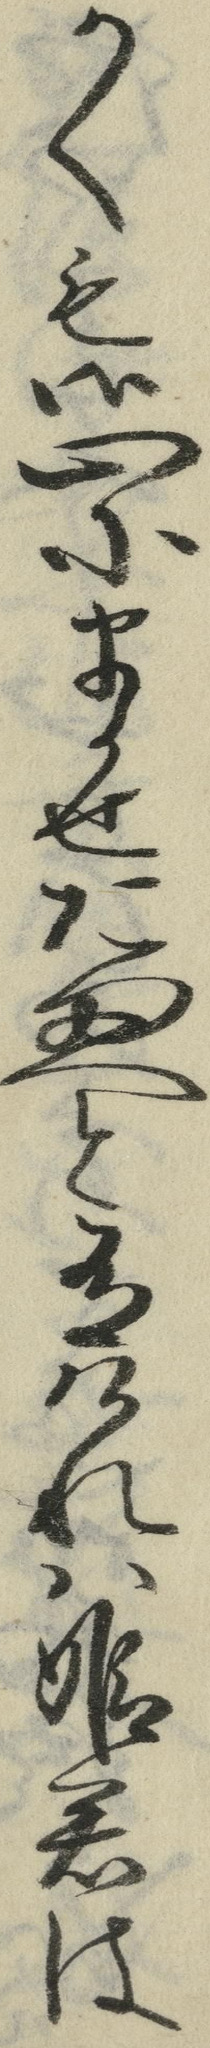かくも御心にまかせたまへと有けれハ姫君は
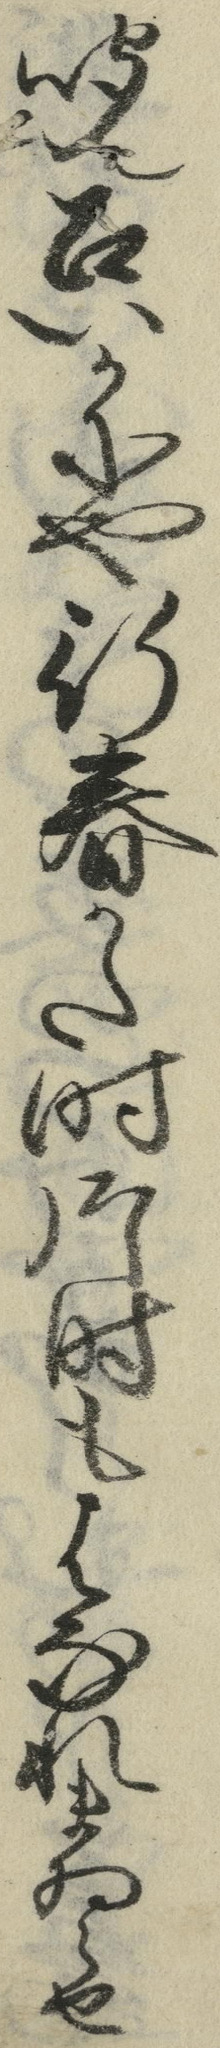聞シ召いかにや行春かた時片時もはなれまゐらせ
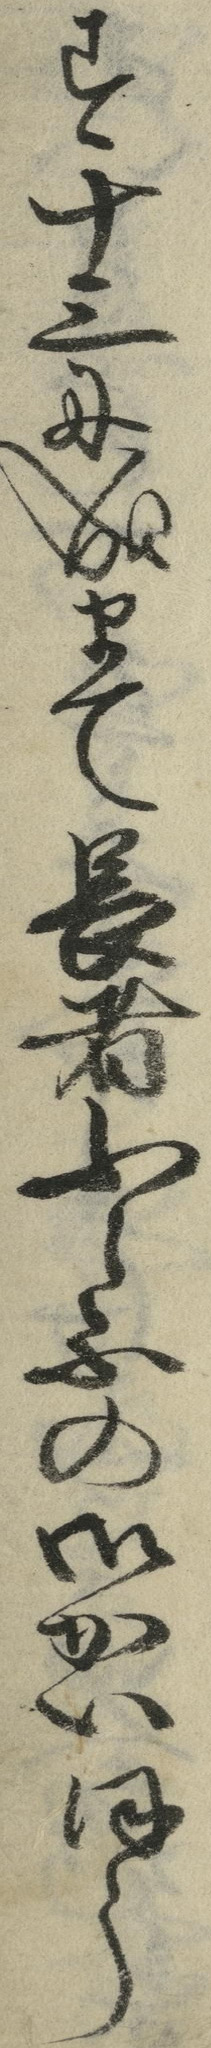す十三に成まて長者ふうふの御かいほう

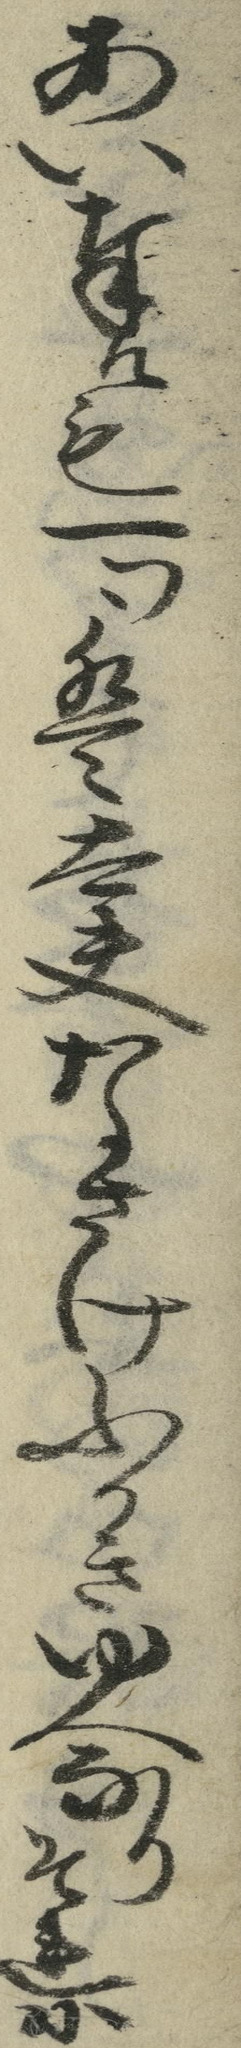あい奉ルも一ツは太夫なさけふかきゆへなりそれに
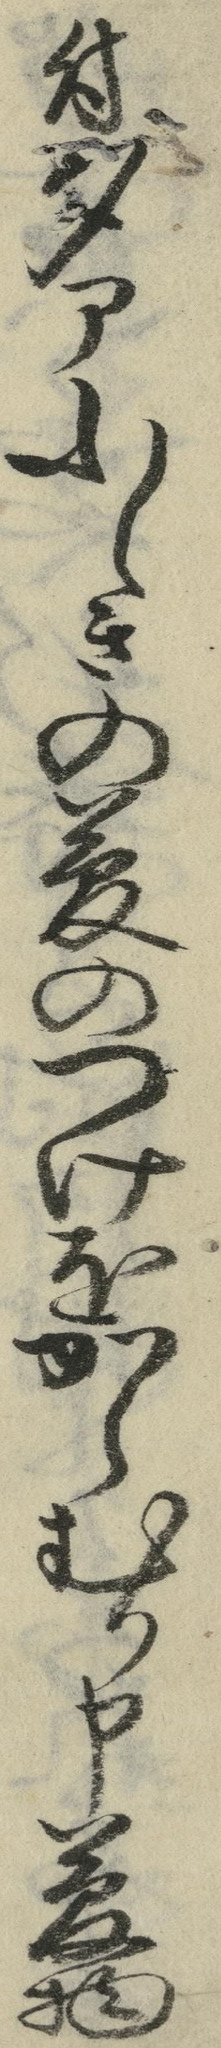付タ部ふしきの夢のつけをかうむり申夢物
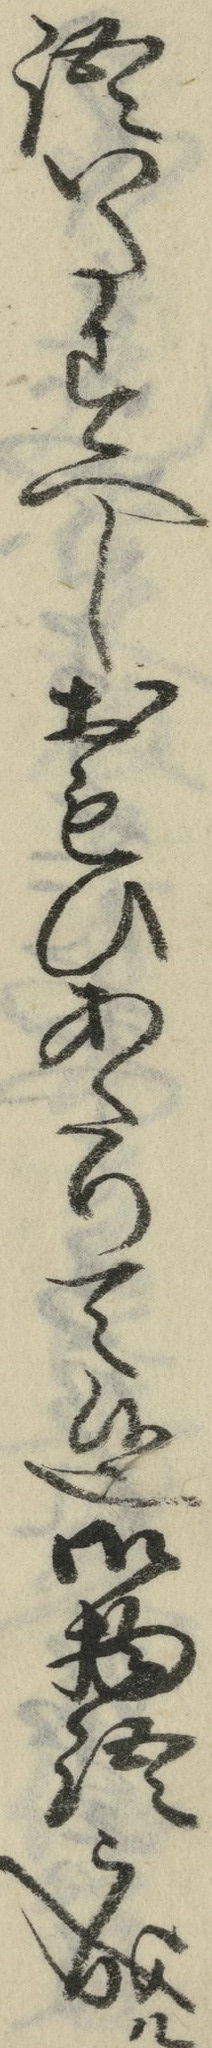語いたすへしおもひあたりて候也物語被成ル
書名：浅間記
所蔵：東京大学地震研究所図書室 Earthquake Research Institute Library, The University of Tokyo, JAPAN
